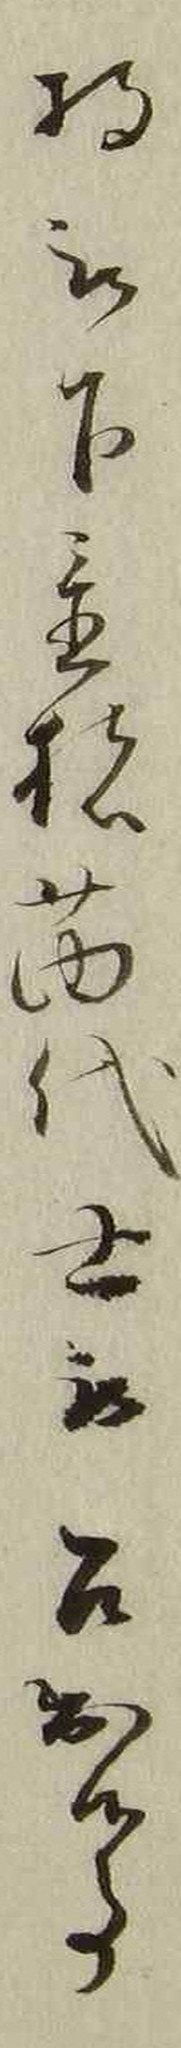持被下置猪苗代士被召出候事
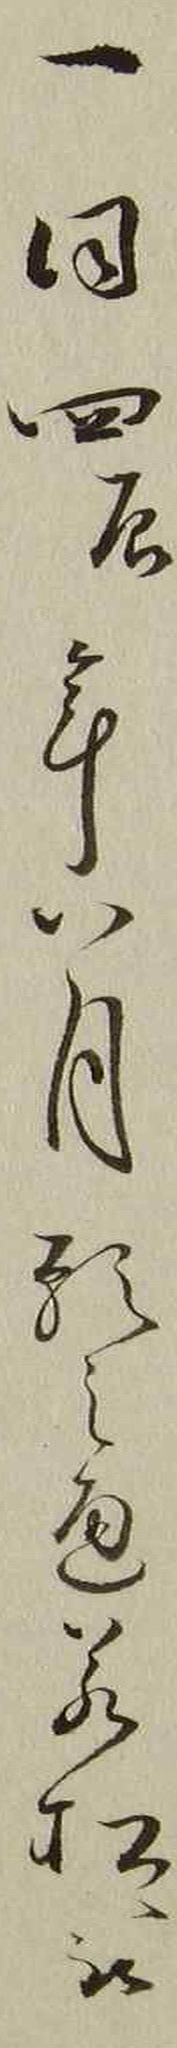一同四辰年八月願之通若松へ被
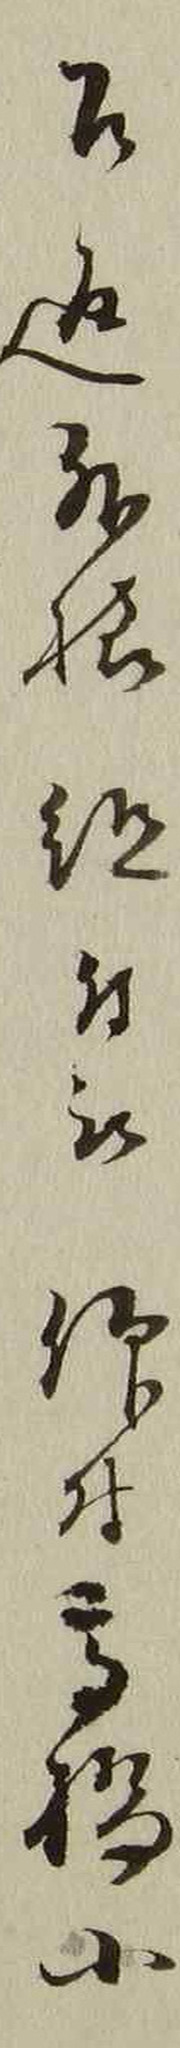召返外様組付被仰付高橋小
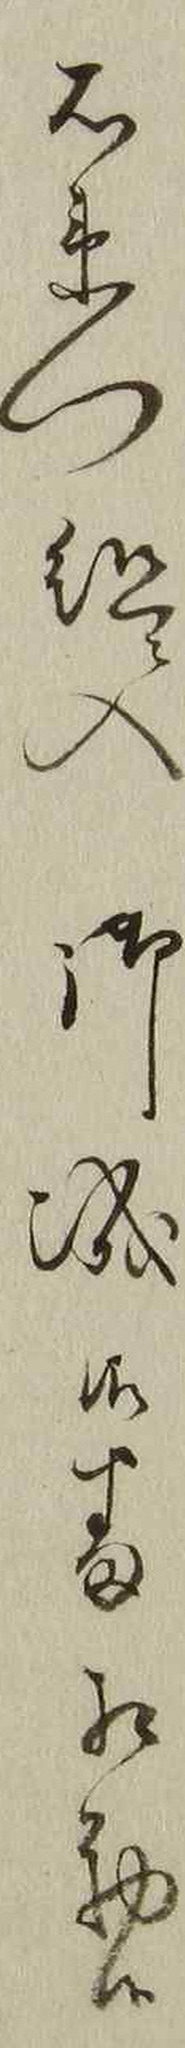右衛門組ニ入御城御番相勤御
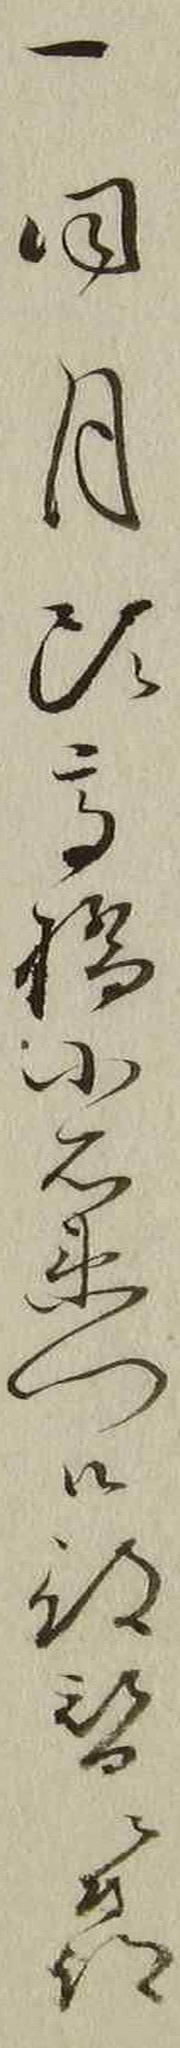一同月頭高橋小右衛門御役替ニ付跡
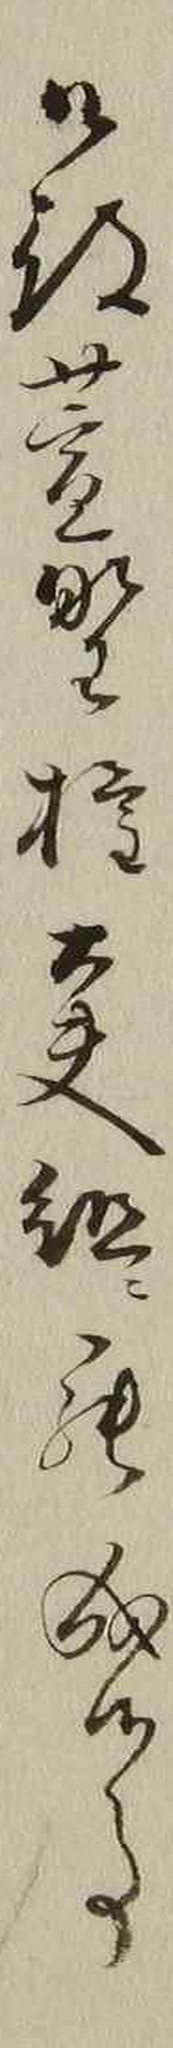御役萱野権大夫組ニ罷成候事
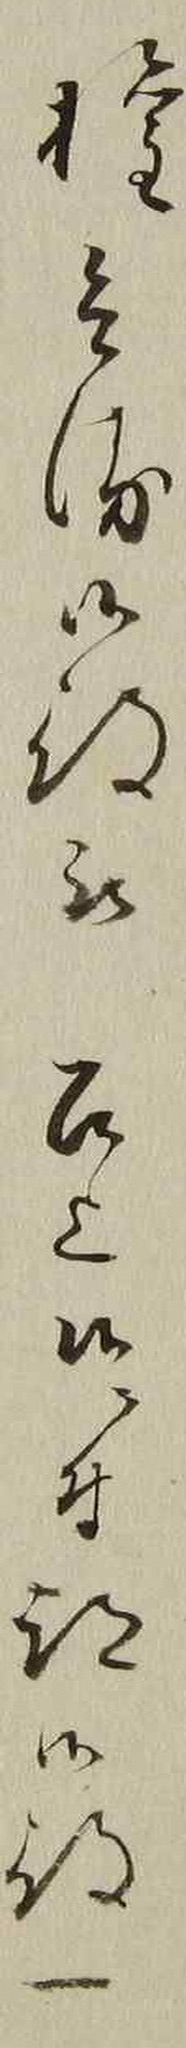権兵衛御役被召上候ニ付跡御役一
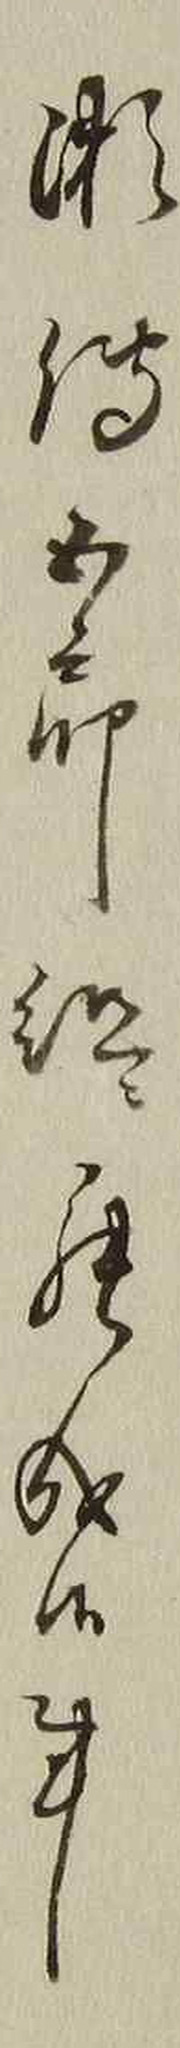瀬伝五郎組ニ罷成候事
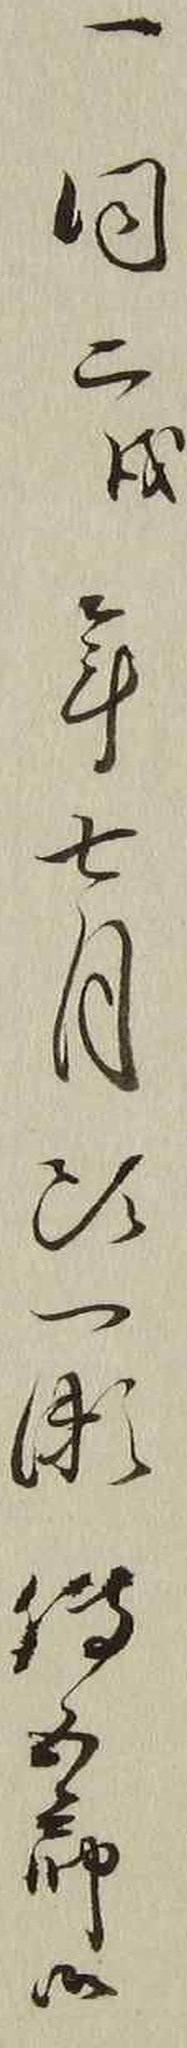一同二戌年七月頭一瀬伝五郎御
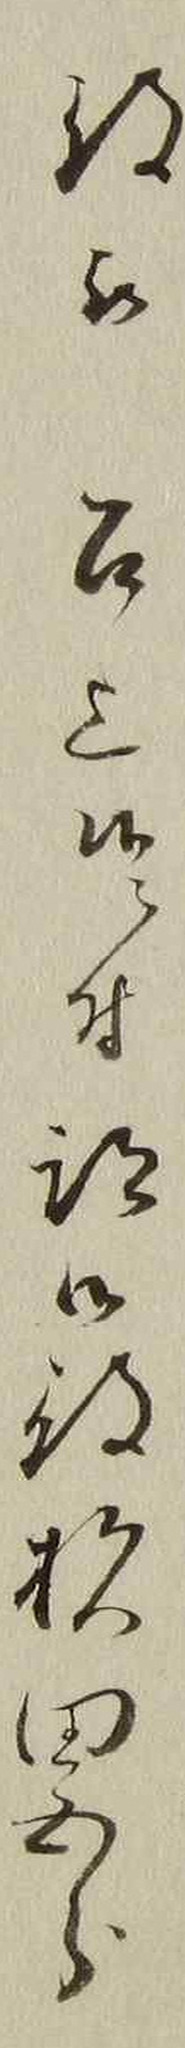役被召上候ニ付跡御役杉田五郎
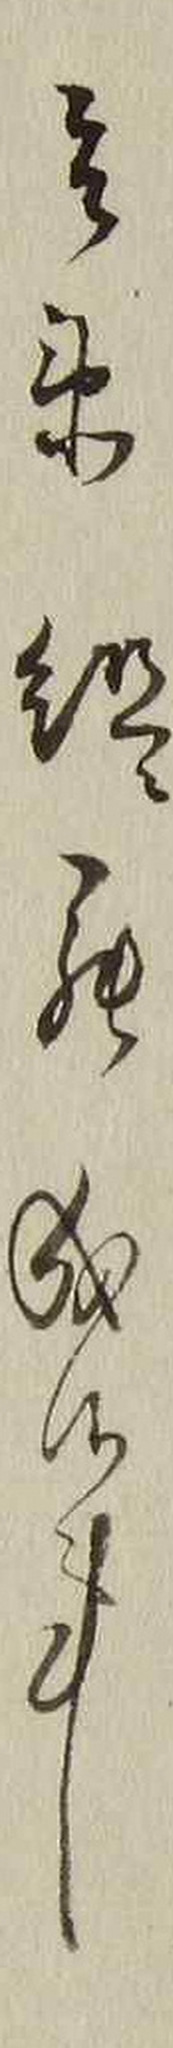兵衛組ニ罷成候事
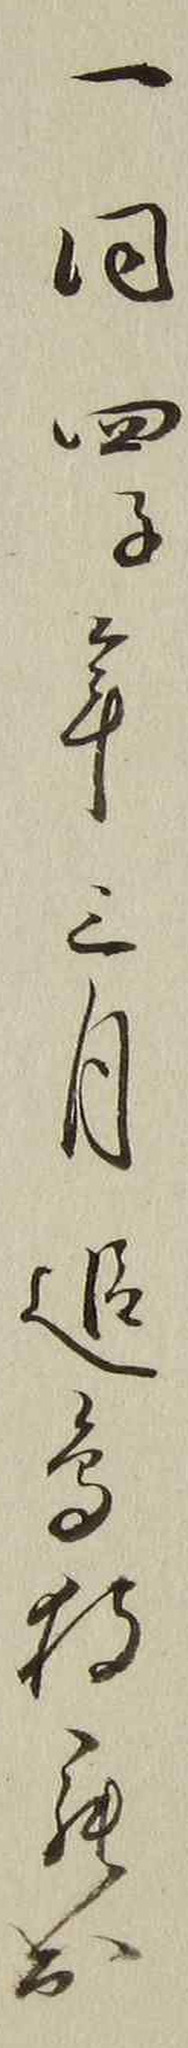一同四子年三月追鳥狩罷出
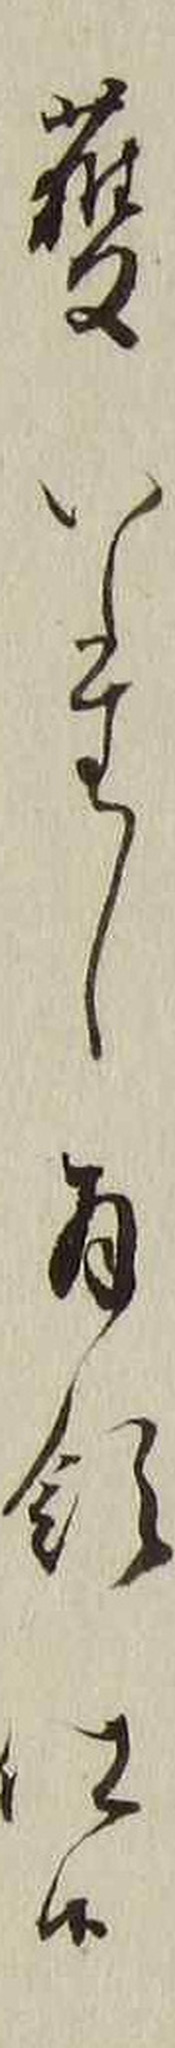獲いたし拝領仕候
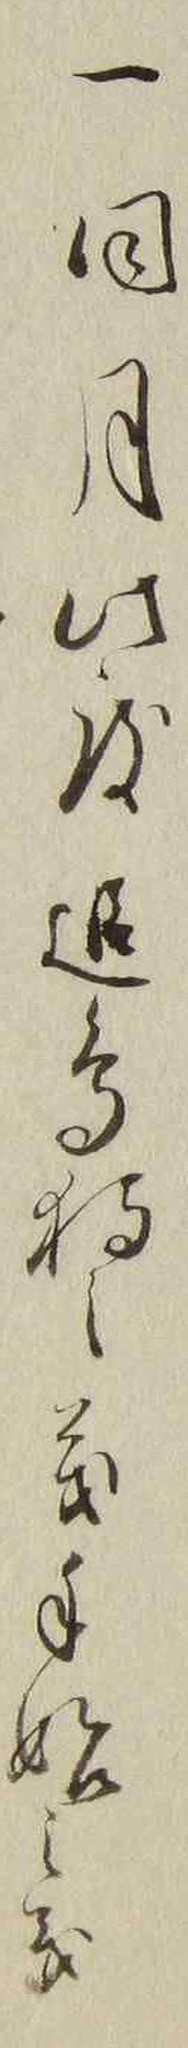一同月此度追鳥狩之義手始之義
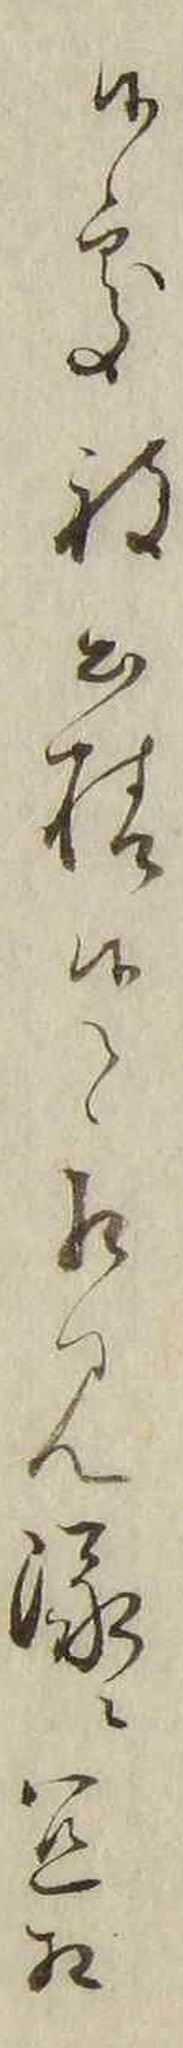候処被出精候と相見隊ニ宜相

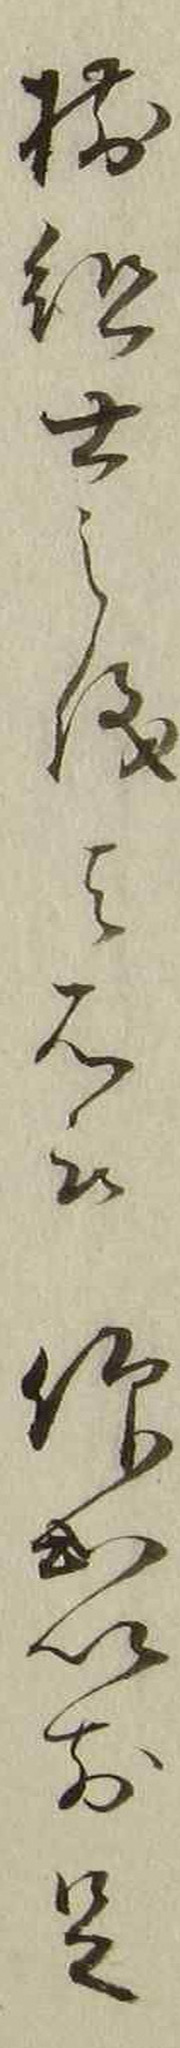揃組士之儀与右被仰出以前足
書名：諸士系譜　巻之129　た之部5
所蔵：会津若松市立会津図書館
